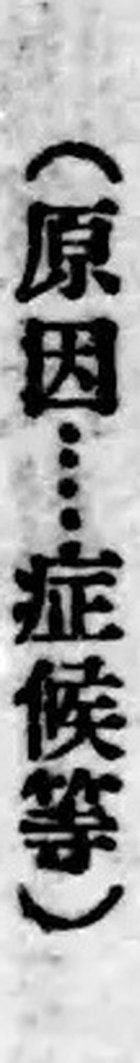(原因…症候等)
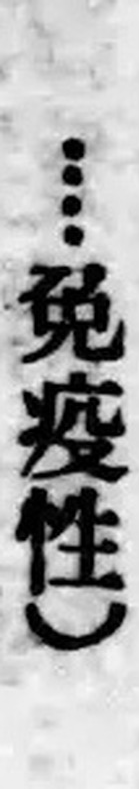…免疫性)
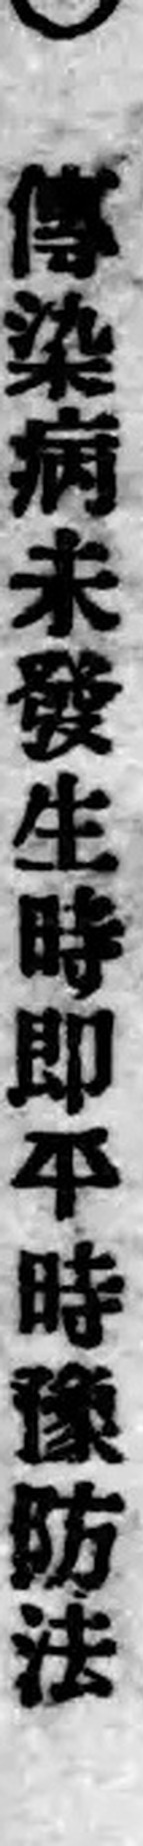(甲)傅染病未發生時即平時豫防法
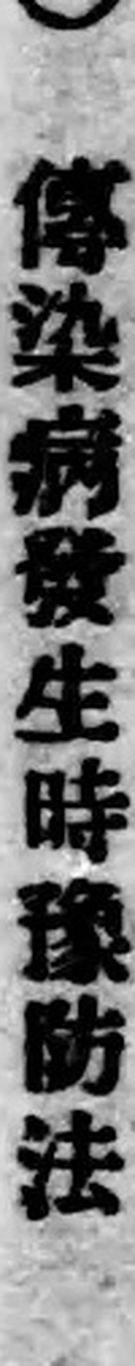(乙)傅染病發生時豫防法
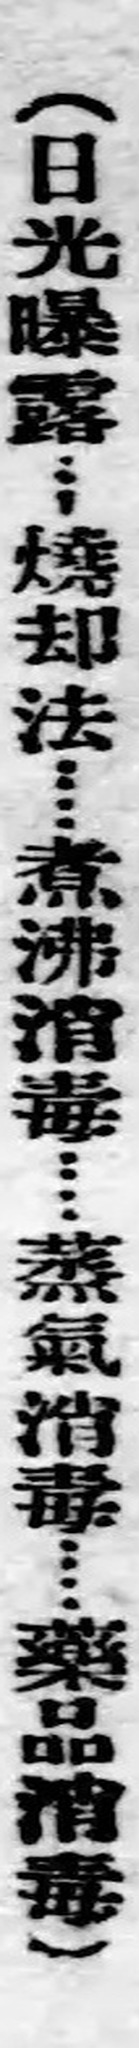(日光曝露…燒却法…煮沸消毒…蒸氣消毒…藥品消毒)
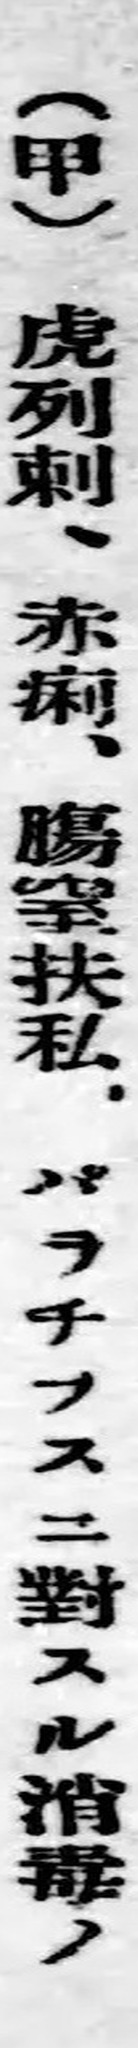(甲)虎列刺、赤痢、膓窒扶私、パラチフスニ對スル消毒ノ
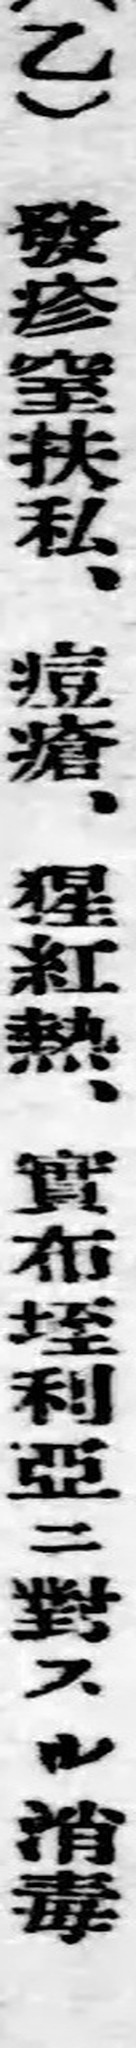(乙)發疹窒扶私、痘瘡、猩紅熱、實布垤利亞ニ對スル消毒
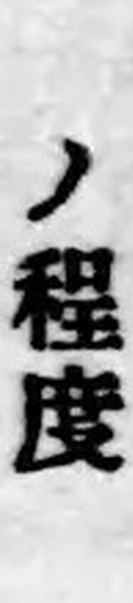ノ程度
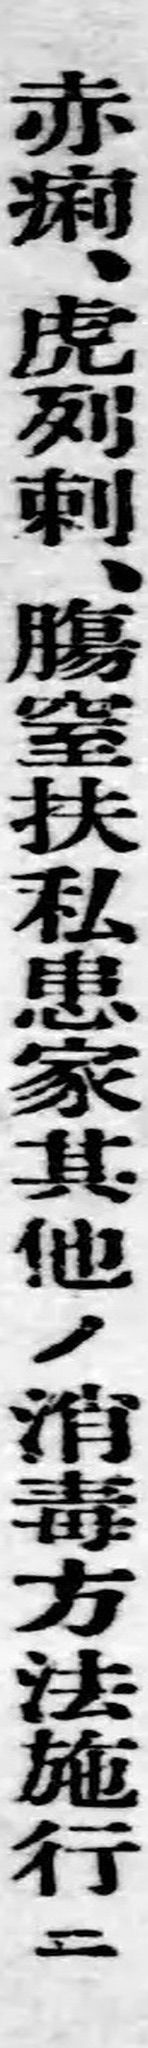赤痢、虎列刺、膓窒扶私患家其他ノ消毒方法施行ニ

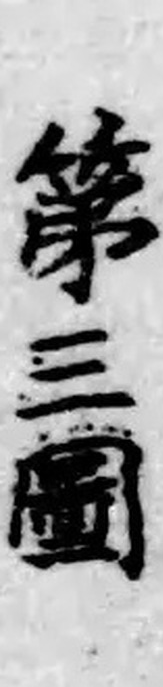第三圖
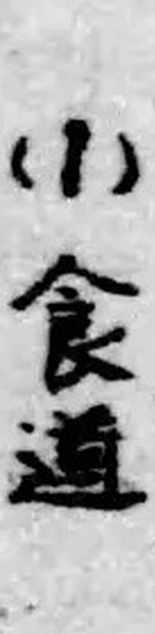(１)食道

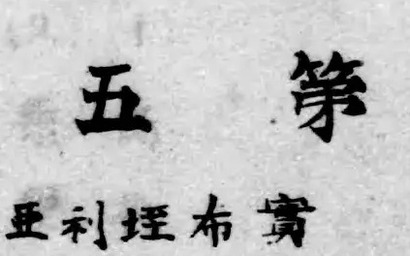第五圖

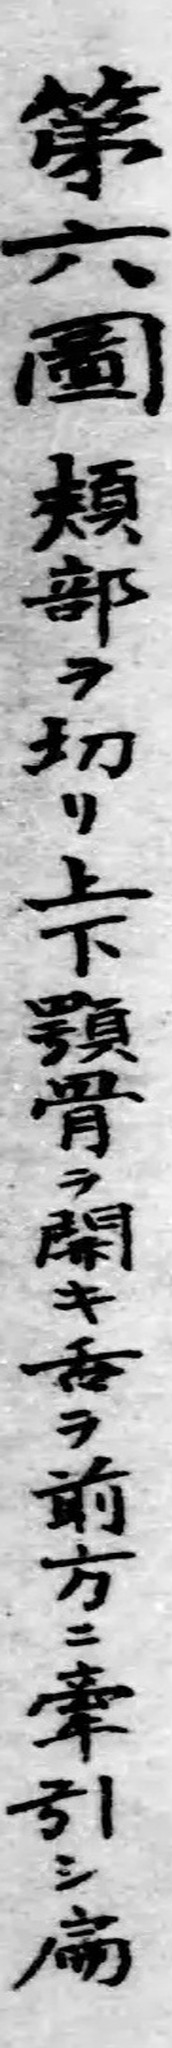第六圖頬部ヲ切リ上下顎骨ヲ開キ舌ヲ前方ニ牽引シ扁
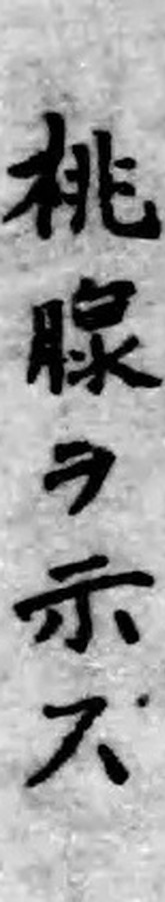桃腺ヲ示ス

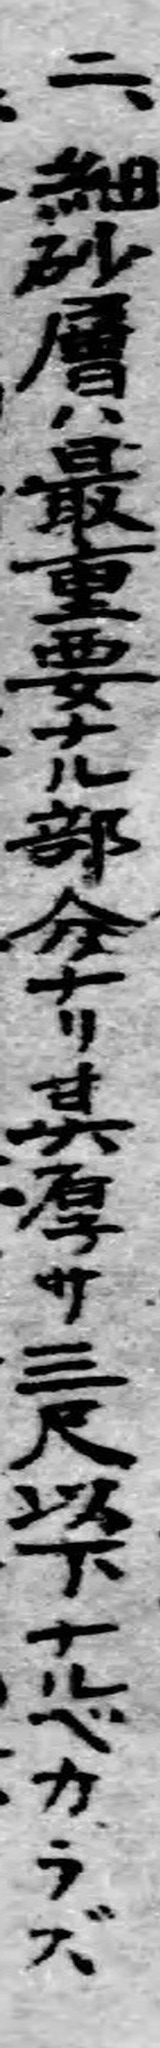二、細砂層ハ最重要ナル部分ナリ其厚サ三尺以下ナルベカラズ
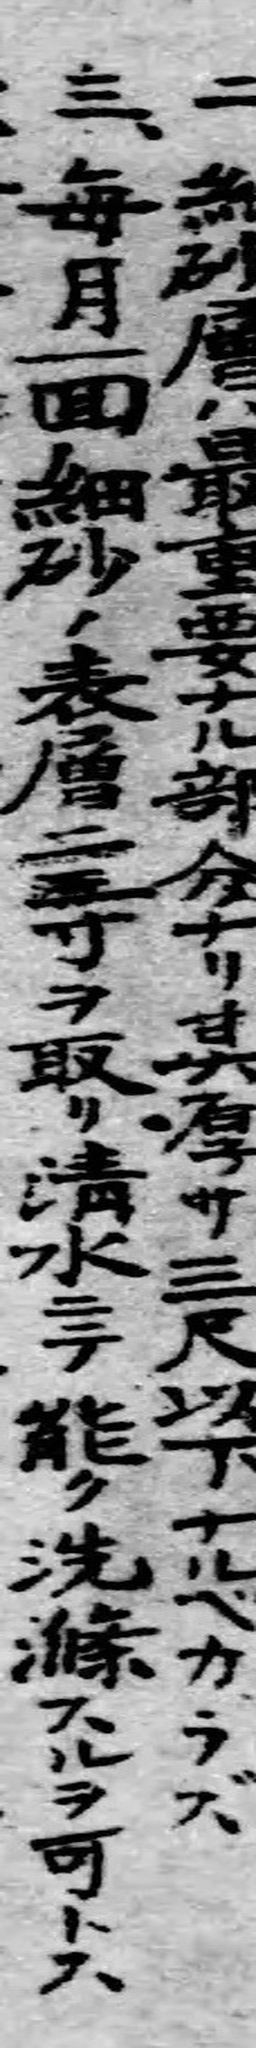三、毎月一回細砂ノ表層二三寸ヲ取リ清水ニテ能ク洗滌スルヲ可トス
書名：袖珍防疫必携
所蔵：国立国会図書館 National Diet Library, JAPAN
